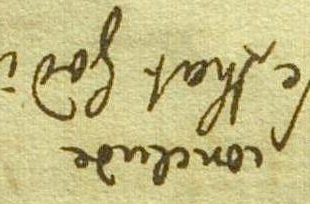conclude
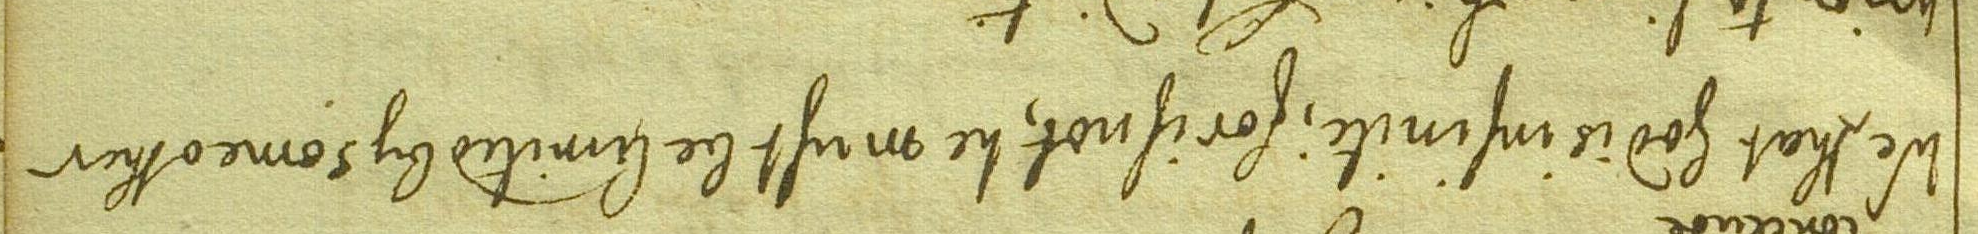We ^ that God is infinite; for if not, he must be limited by some other
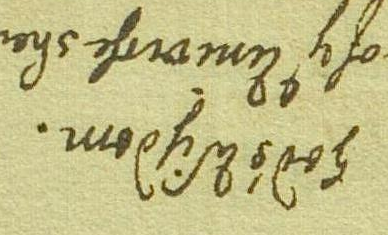God's Wisdom.
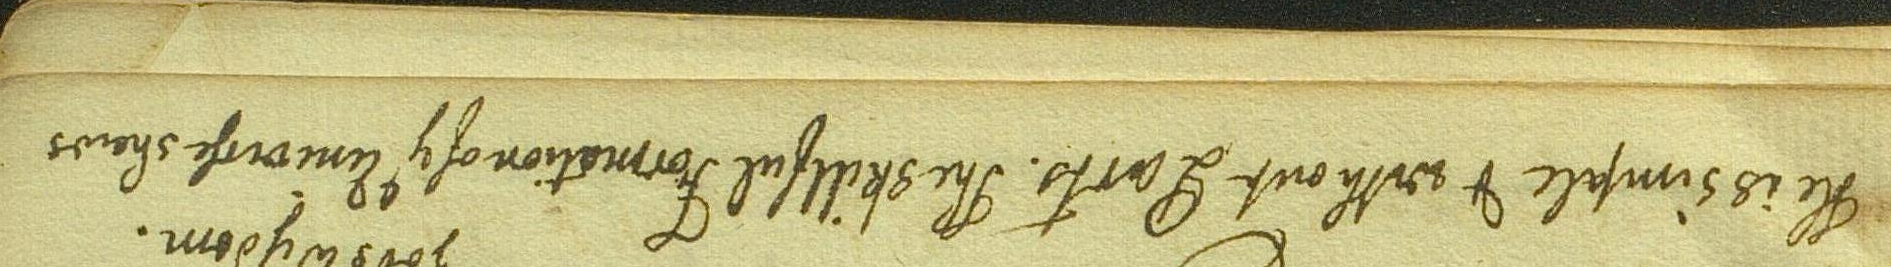He is simple & without Parts. The skillful Formation of y^e Universe shows
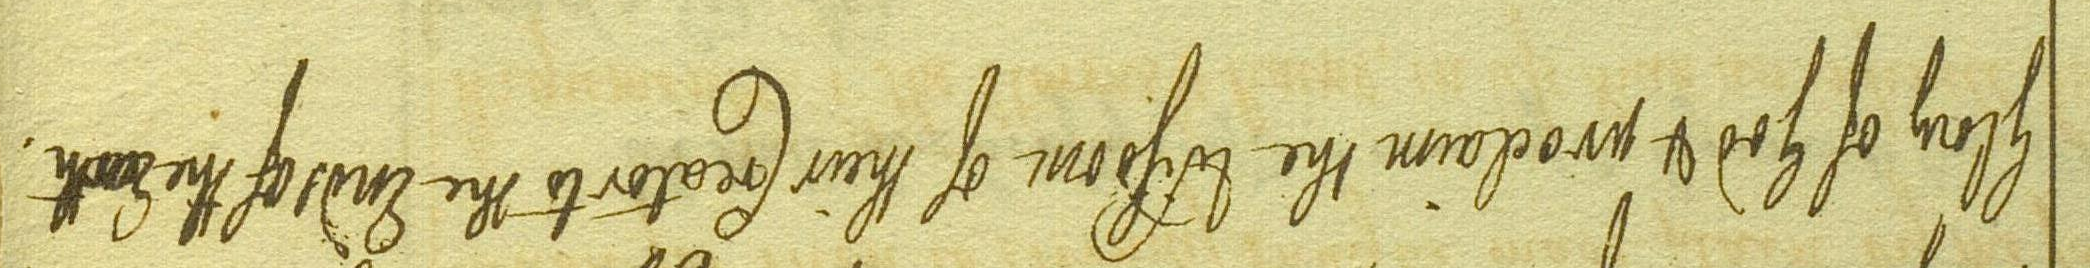Glory of God & proclaim the Wisdom of their Creator to the Ends of the Earth.
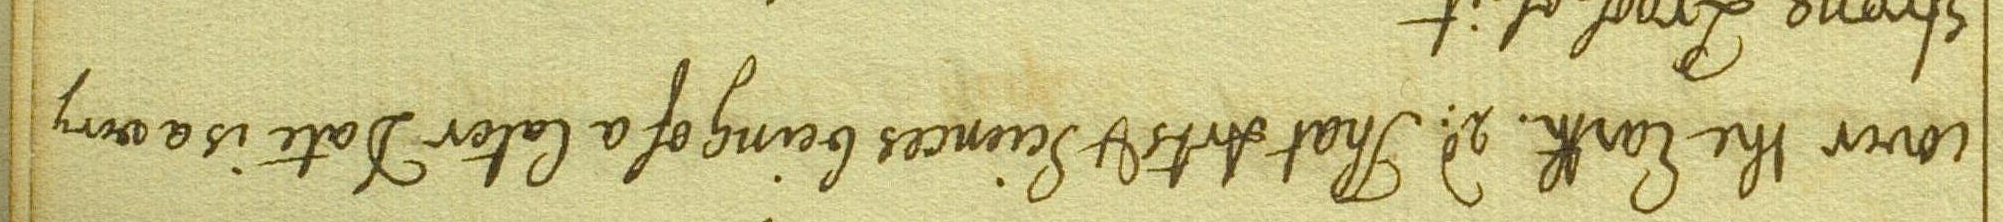cover the Earth. 2^d. That Arts & Sciences being of a later Date is a very
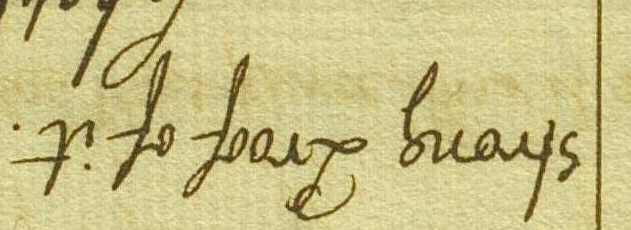strong Proof of it.
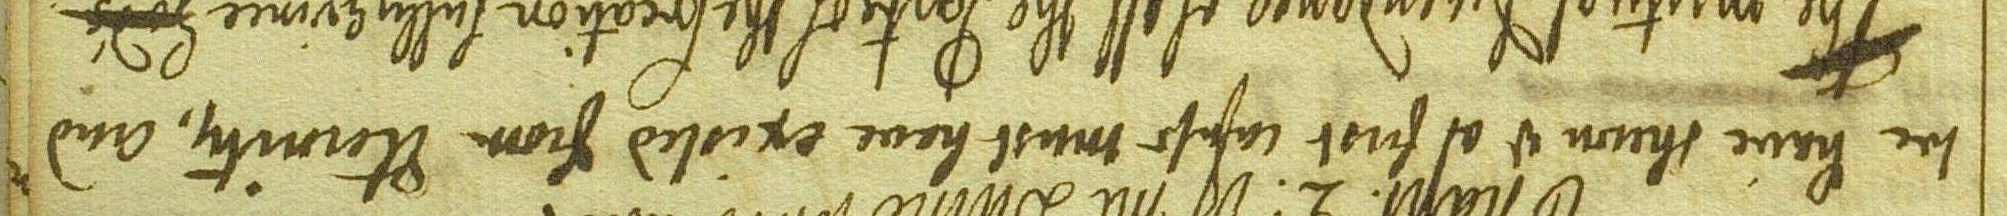We have shown a first cause must have existed from Eternity, and
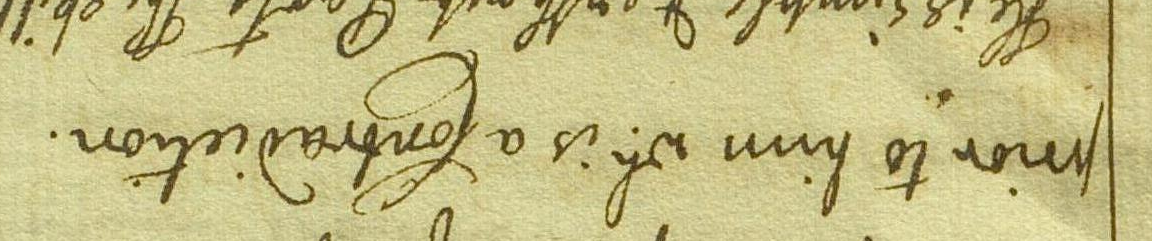prior to him w^h. is a Contradiction.
